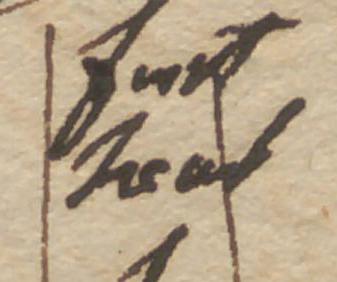heat
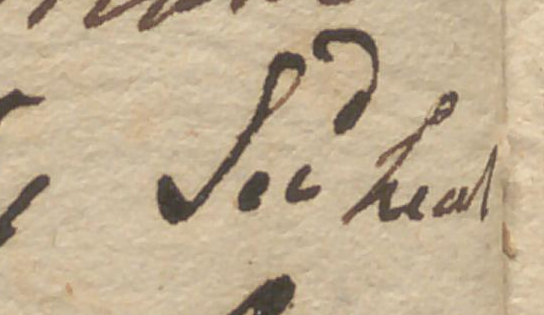Sec^d heat
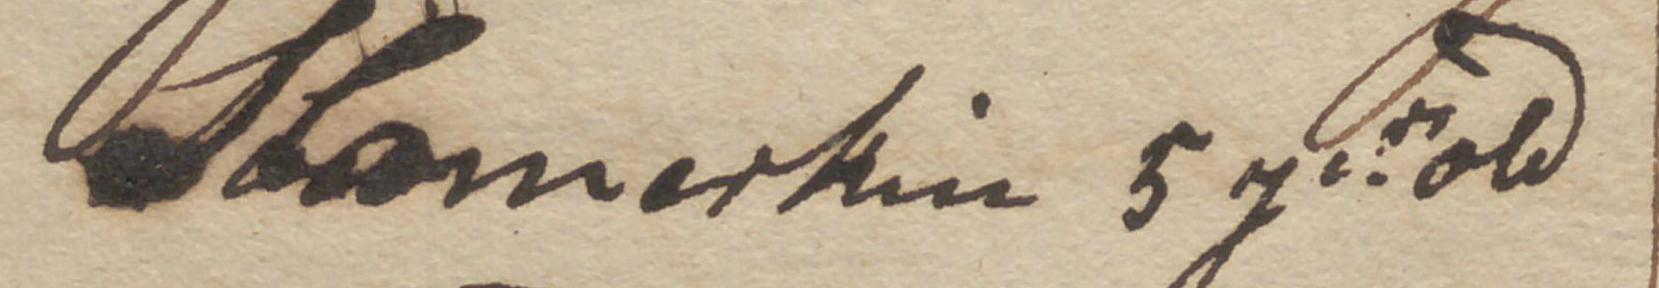Slamerkin 5 ye^rs. old
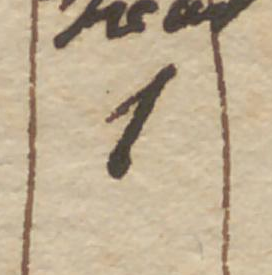1
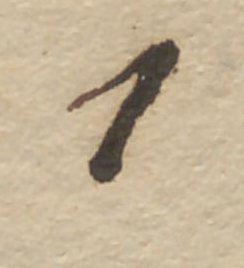1
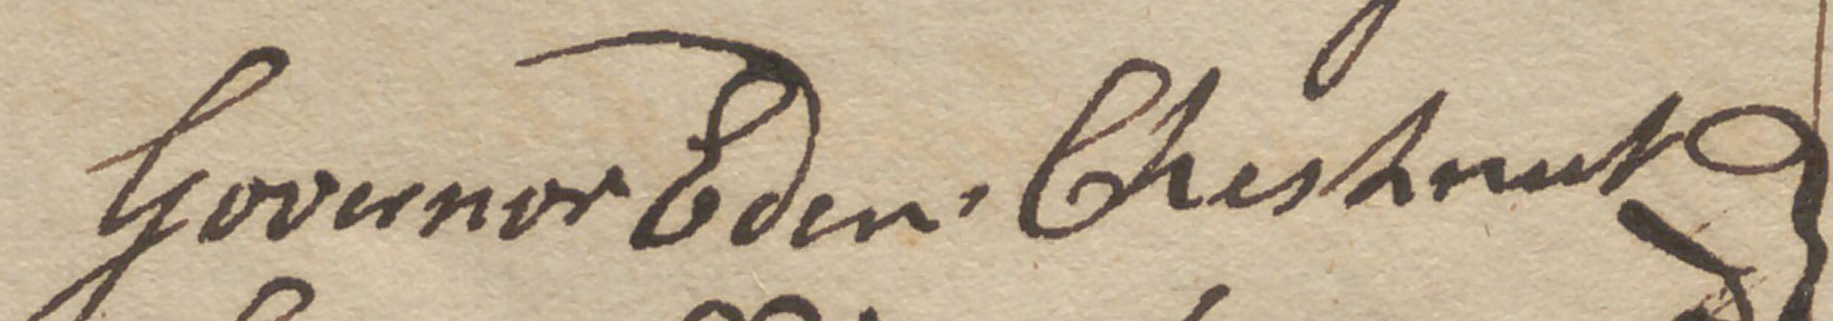Governor Edens Chestnut
